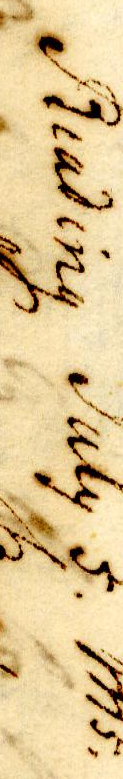Reading July 5^th. 1775.
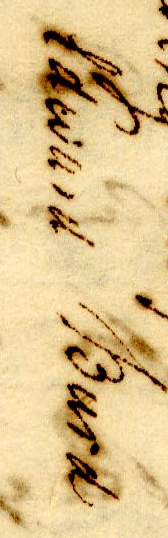Edward Burd
